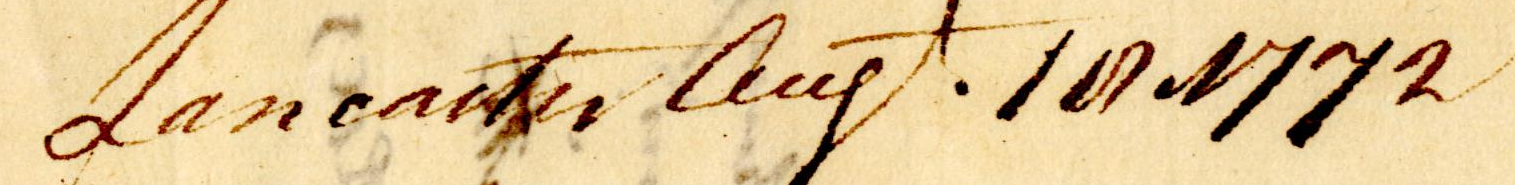Lancaster Aug^t. 10 1772
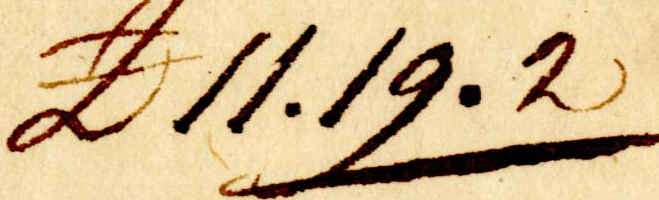£ 11.19. 2
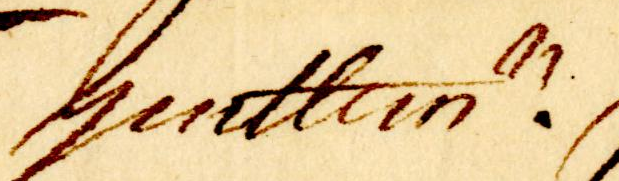Gentle^n.
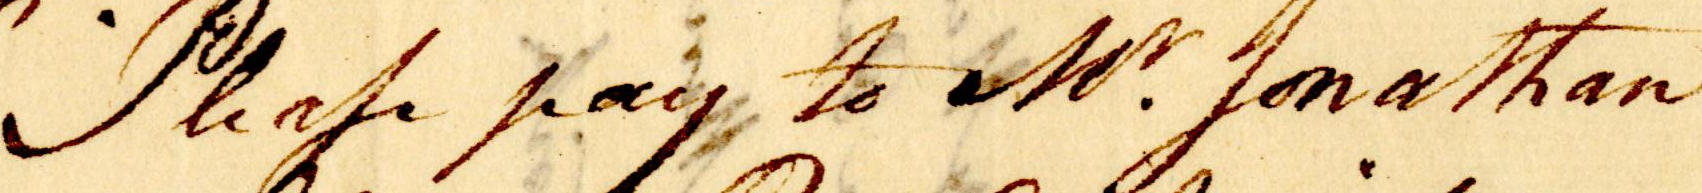Please pay to M^r. Jonathan
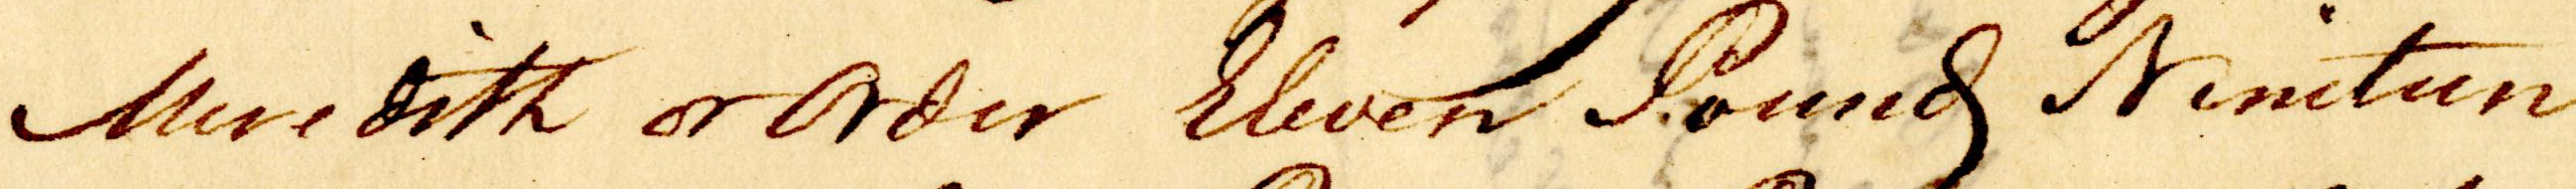Meredith an Order Eleven Pounds Nineteen
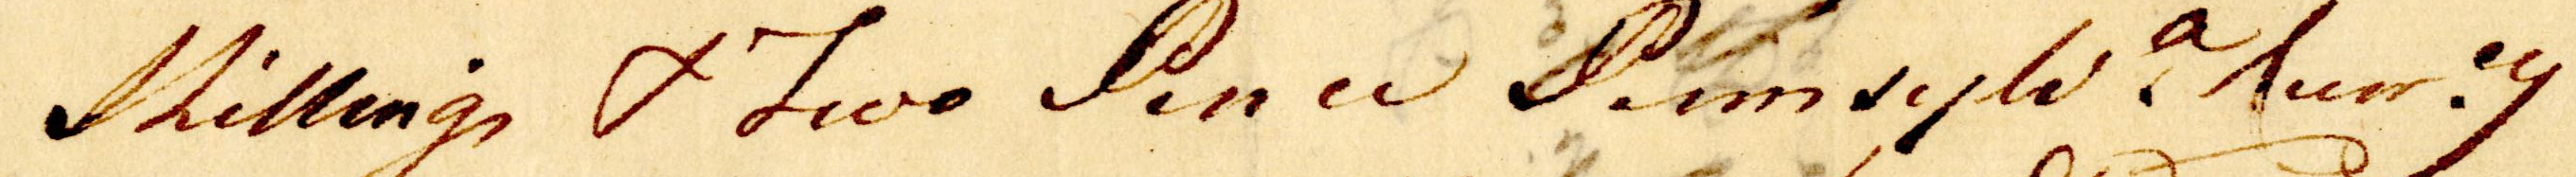shillings & Two Pence Pennsylv^a. Curr^cy.
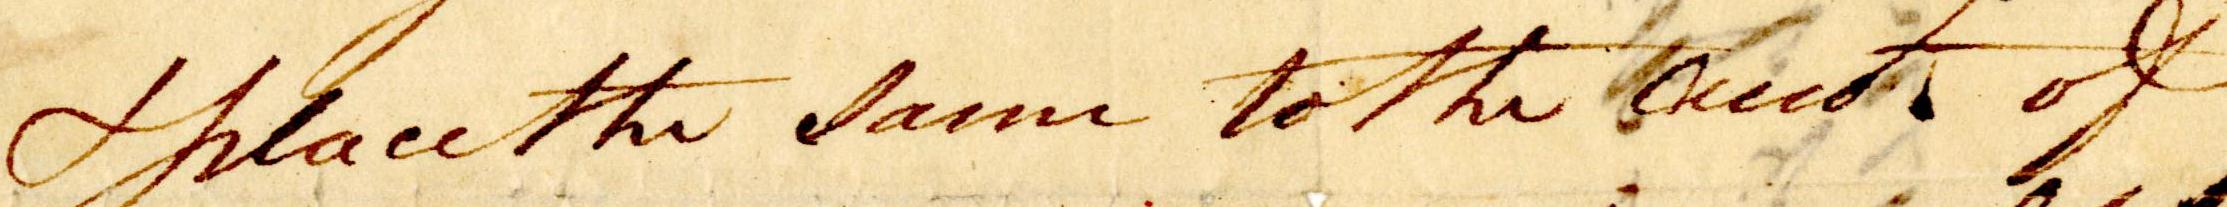& place the same to the acco^t. of
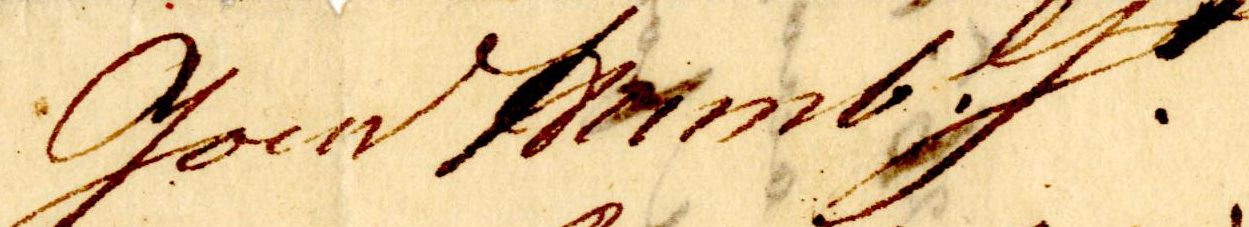Your Humb^l. s^t.
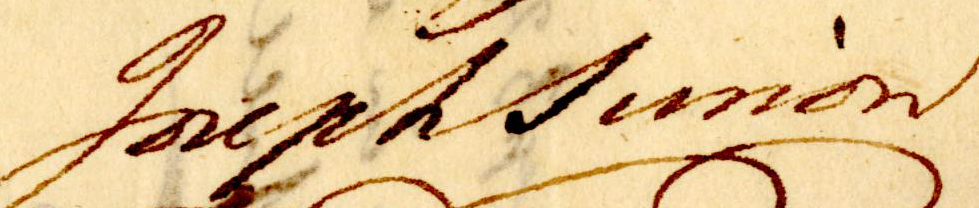Joseph Simon
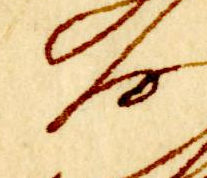To
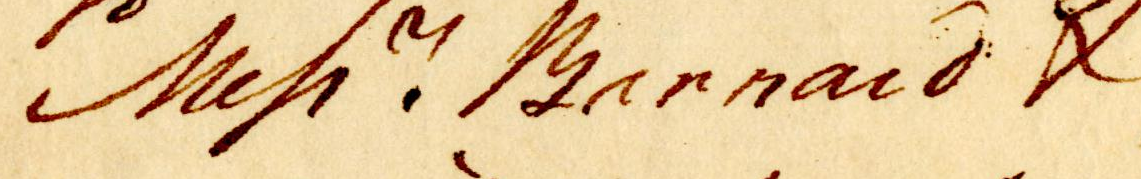Mess^rs. Barnard &
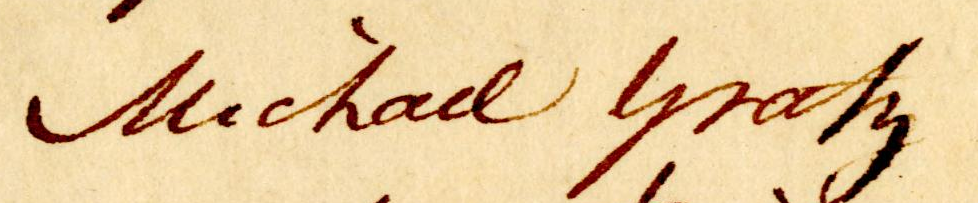Michael Gratz
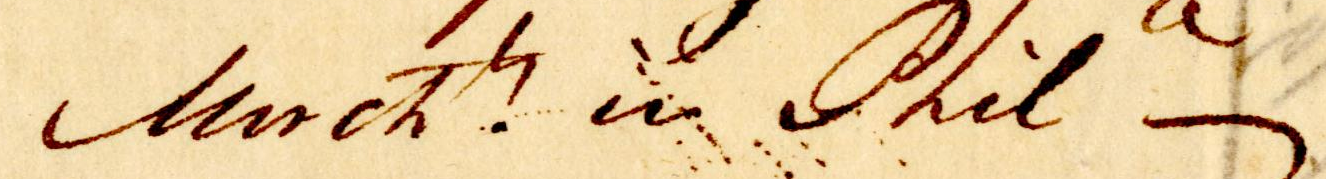Merch^t. in Phil^a.
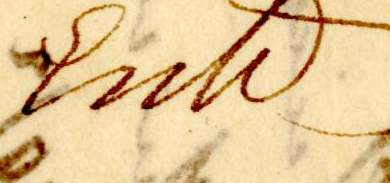Each
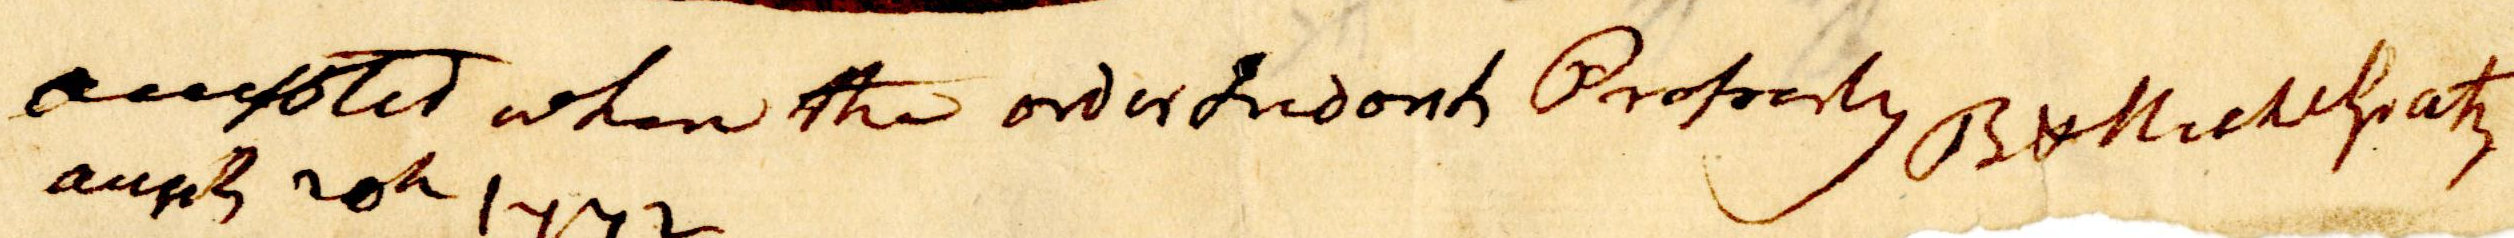accepted when the order fredont Property B & Mich^l Gratz
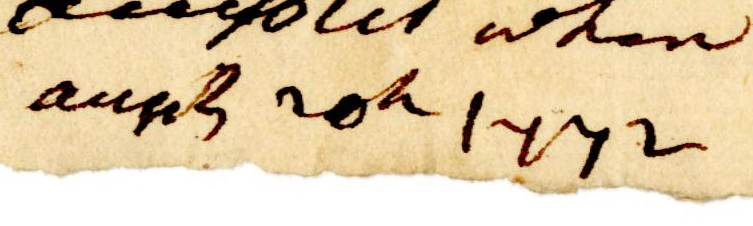Aug^t. 20^h 1772
